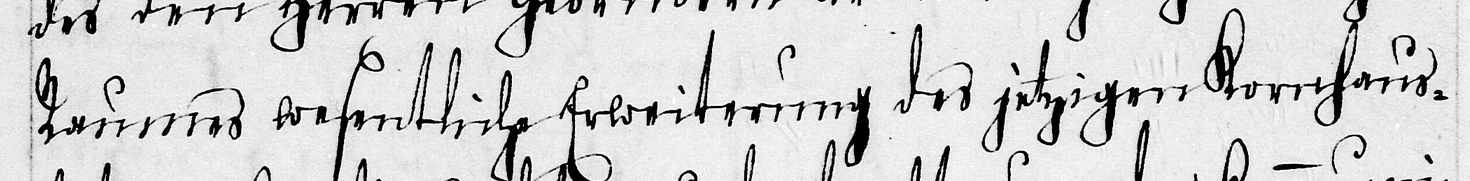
Raumes wesentliche Erweiterung des jetzigen Kornhaus-
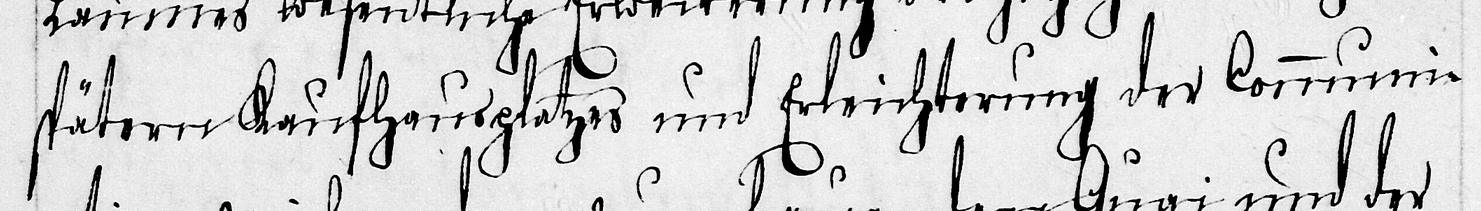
spätern Kaufhausplatzes und Erleichterung der Communi¬
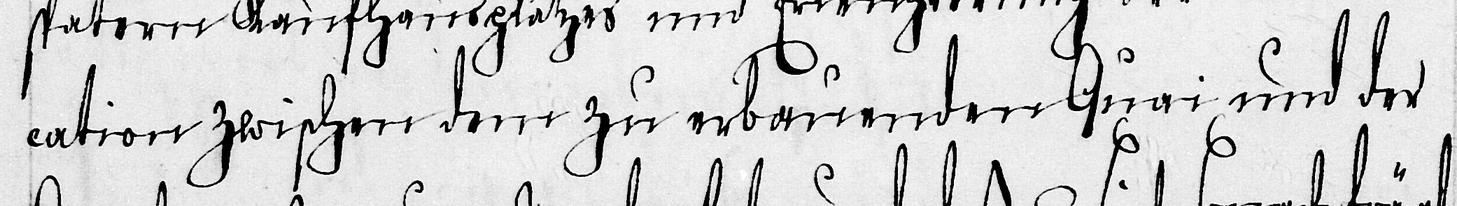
cation zwischen dem zu erbauenden Quai und der
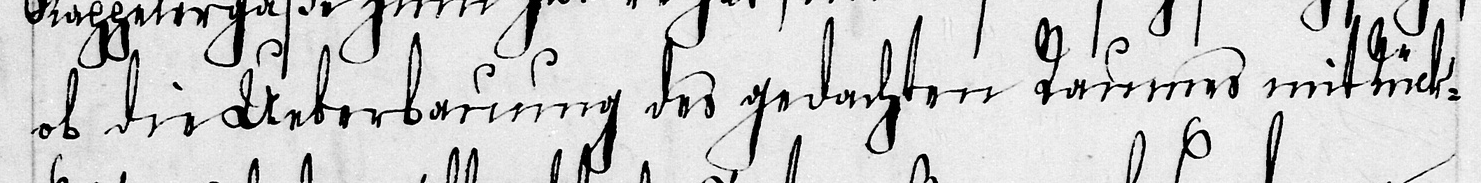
ob die Ueberbauung des gedachten Raumes mit Rück¬
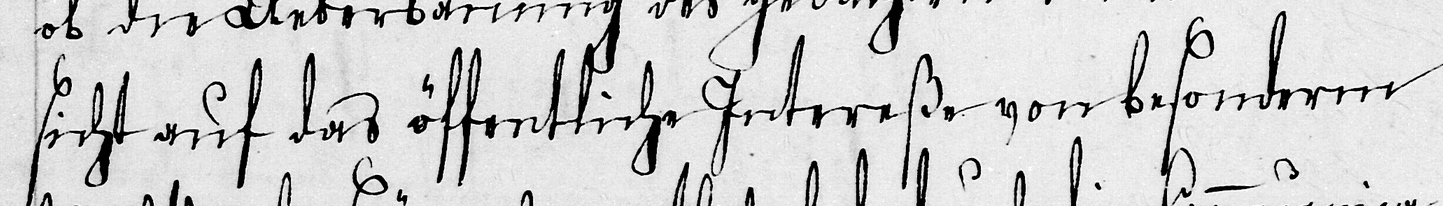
sicht auf das öffentliche Intereße von besonderm
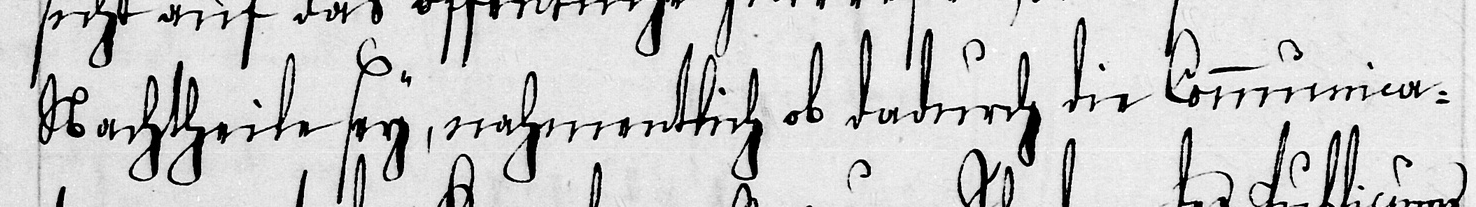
Nachtheile sey, nahmentlich ob dadurch die Communic¬
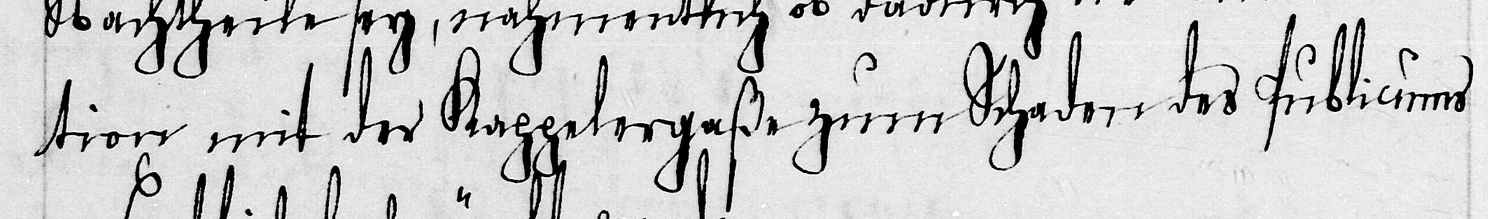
ation mit der Kappelergaße zum Schaden des Publicums
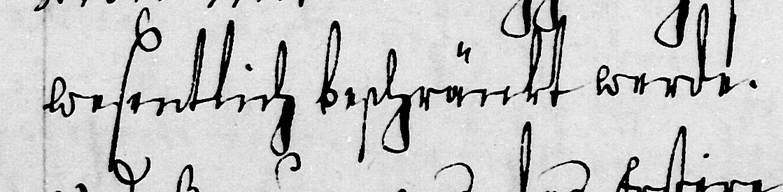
wesentlich beschränkt werde.
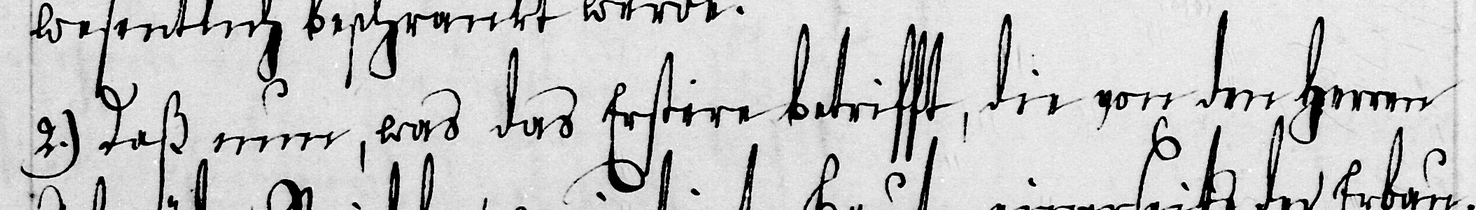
2.) Daß nun, was das Erste betrifft, die von den Herren
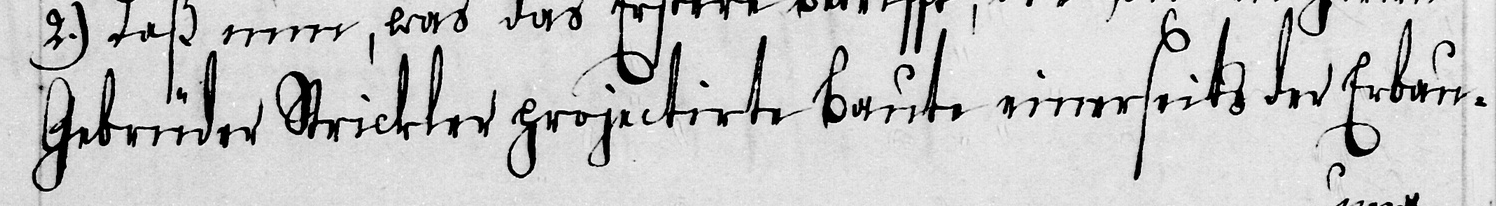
Gebrüder Strickler projectirte Baute einerseits der Erbau-
